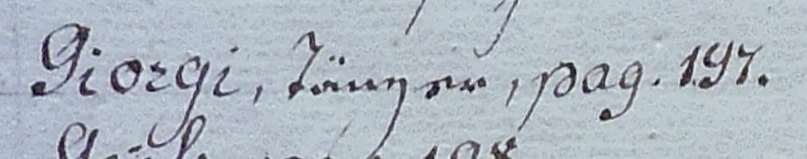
Giorgi, Tänzer, pag. 197.
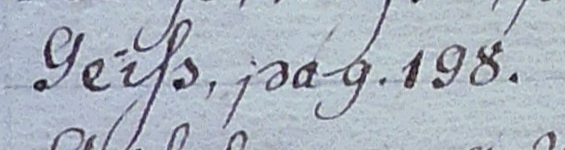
Geiss, pag. 198.
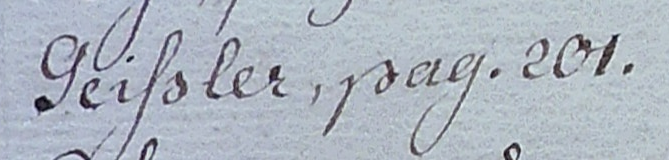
Geissler, pag. 201.
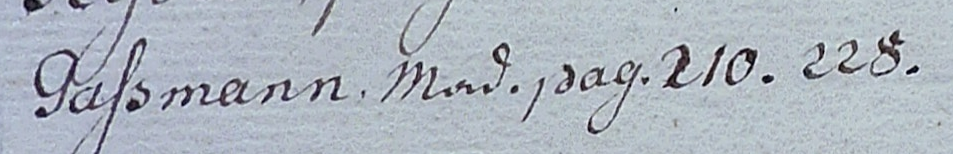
Gassmann, Mad. pag. 210. 228.
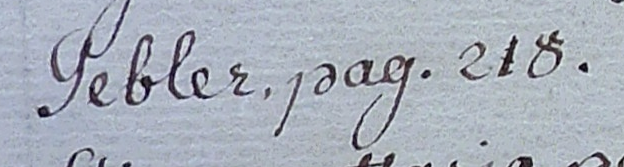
Gebler, pag. 218.
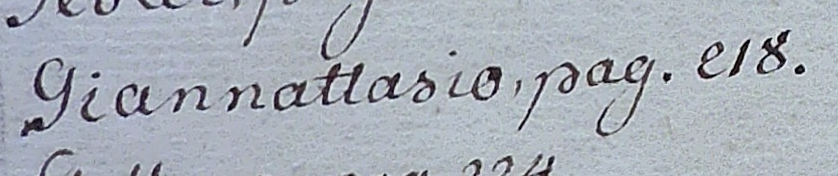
Giannattasio, pag. 218.
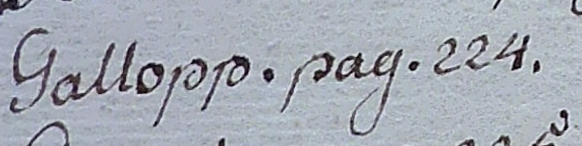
Gallopp. pag. 224.
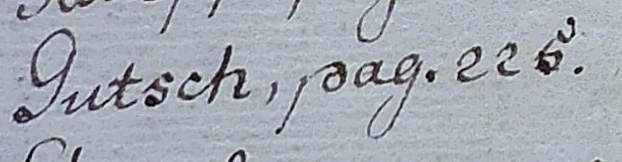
Gutsch, pag. 225.
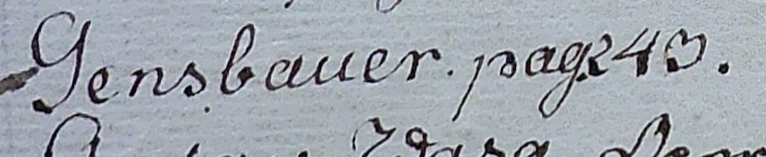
Gensbauer. pag.243.
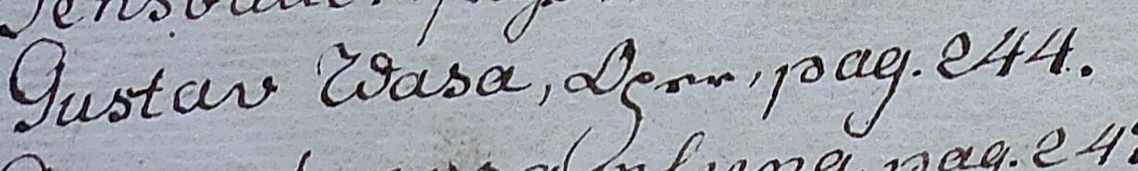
Gustav Wasa, Oper, pag. 244.
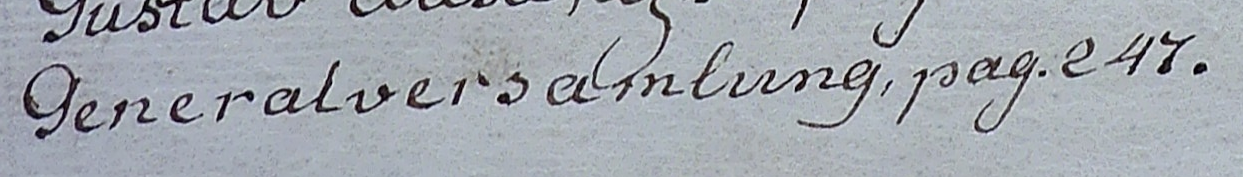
Generalversamlung, pag. 247.
